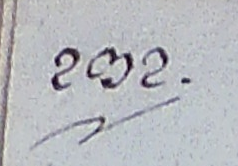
232.
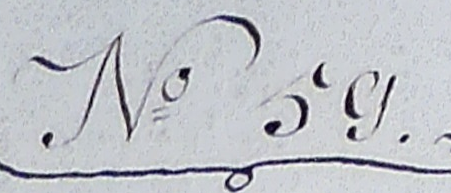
No͇ 59.
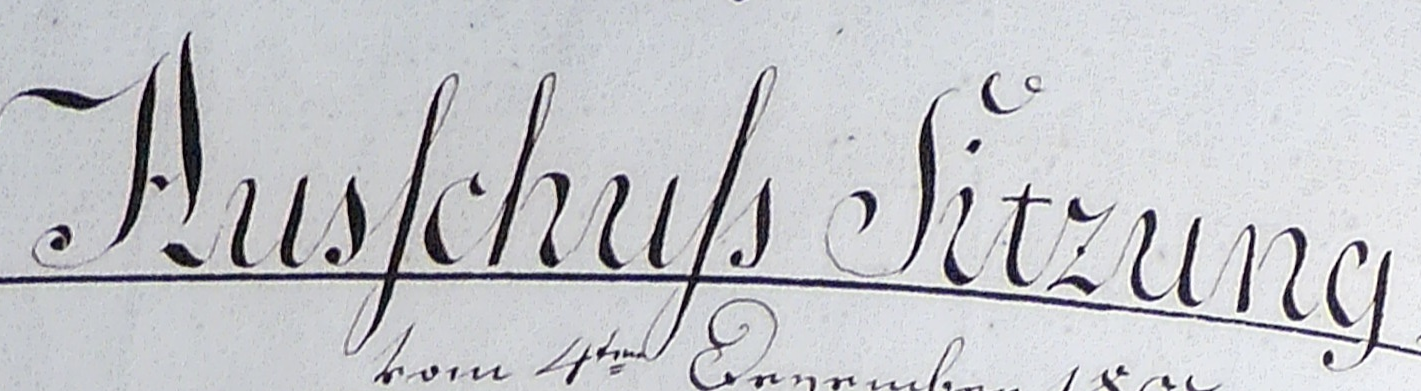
Ausschuss‗Sitzung
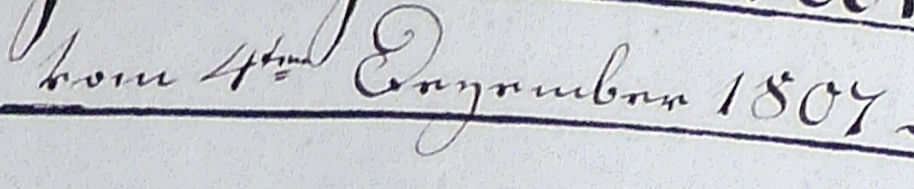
vom 4te͇n Dezember 1807
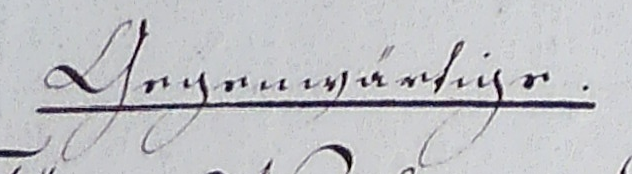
Gegenwärtige.
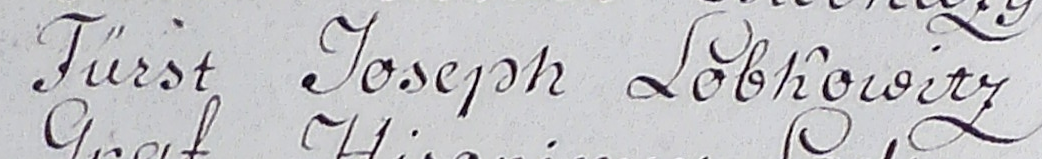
Fürst Joseph Lobkowitz
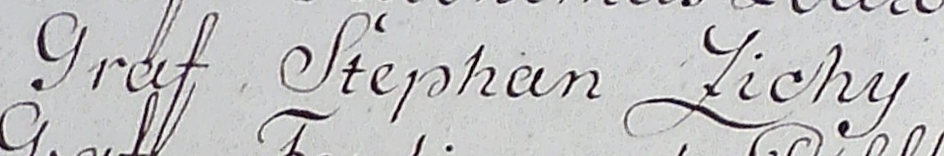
Graf Stephan Zichy
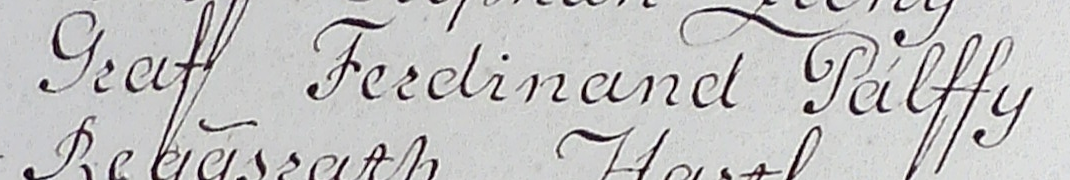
Graf Ferdinand Pálffy
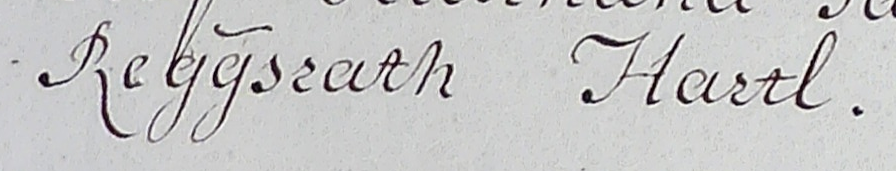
Reg͞gsrath Hartl.
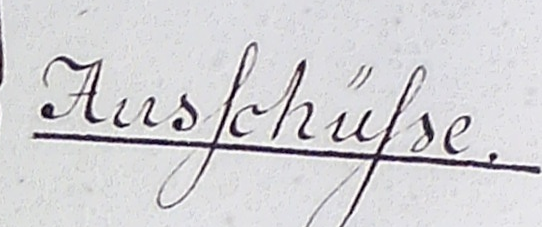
Ausschüsse.
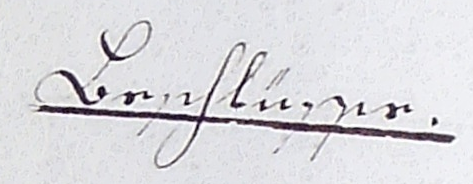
Beschlüsse.
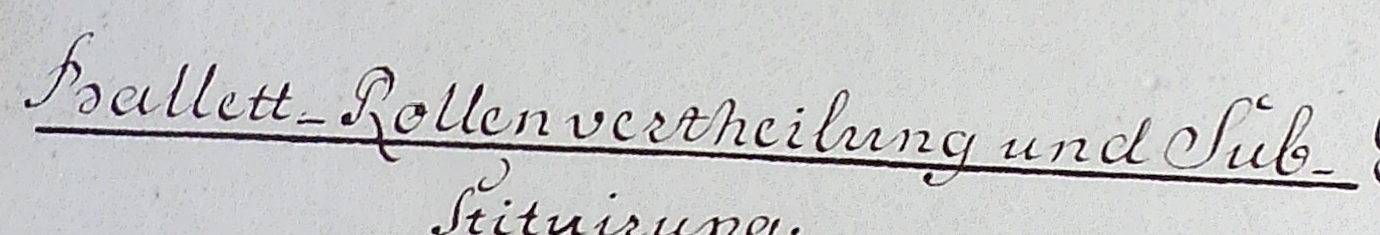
Ballett‗Rollenvertheilung und Sub¬
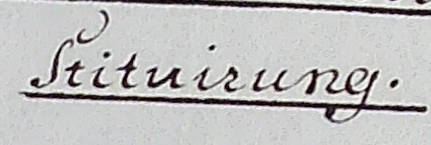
stituirung.
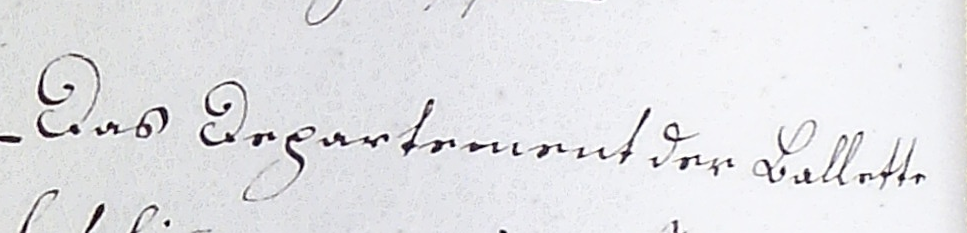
Das Departement der Ballette
